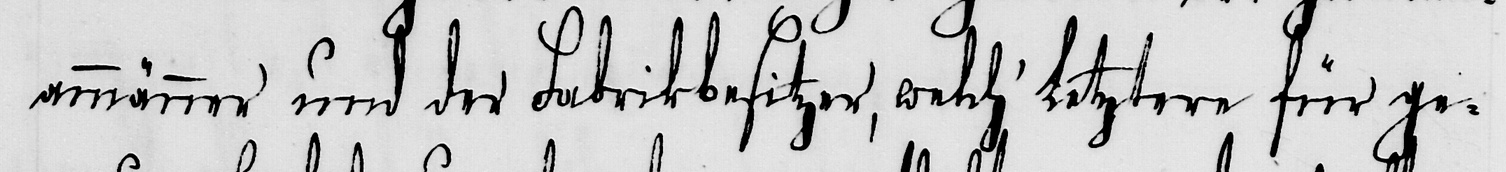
ammänner und der Fabrikbesitzer, welch’ Letztere für ge¬
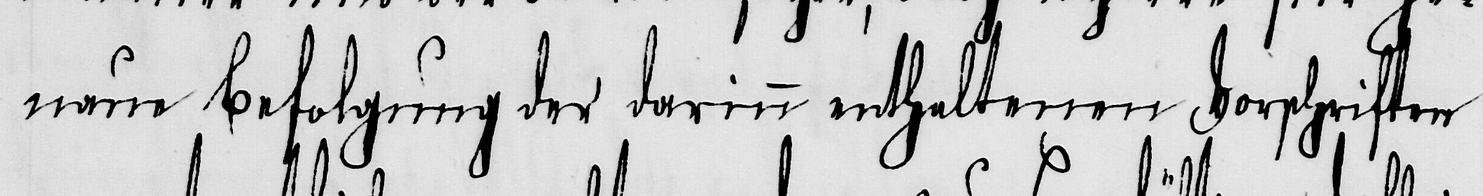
naue Befolgung der darinn enthaltenen Vorschriften
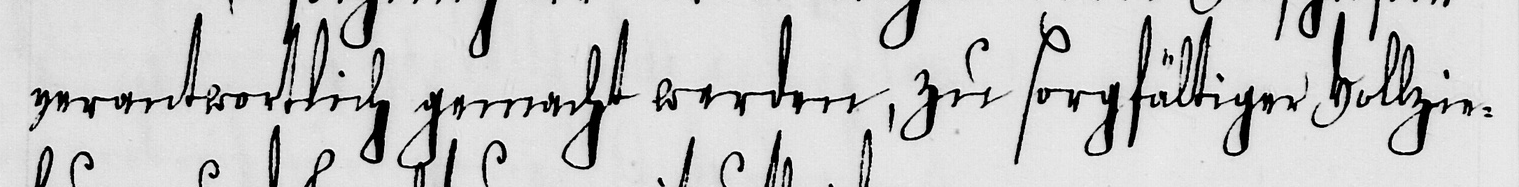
verantwortlich gemacht werden, zu sorgfältiger Vollzie¬
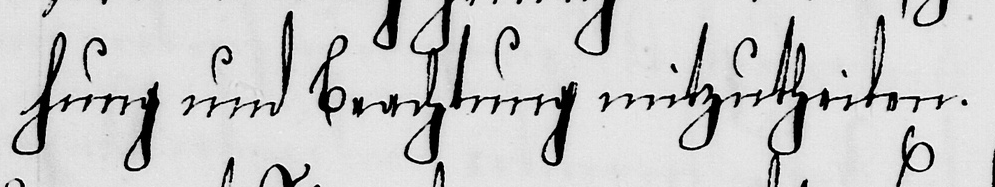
hung und Beachtung mitzutheilen.
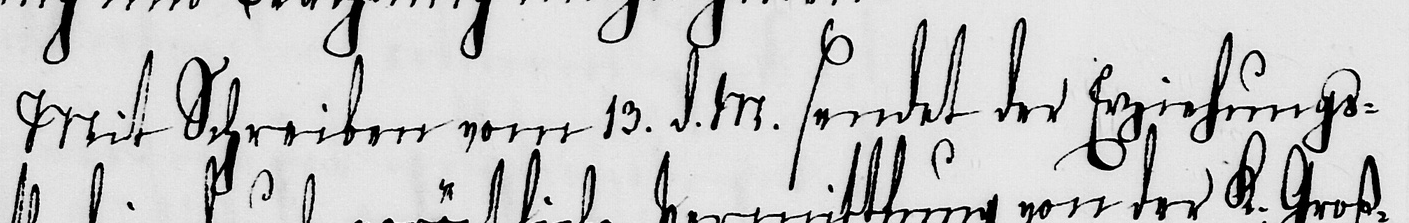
Mit Schreiben vom 13. d. M. sendet der Erziehungs¬
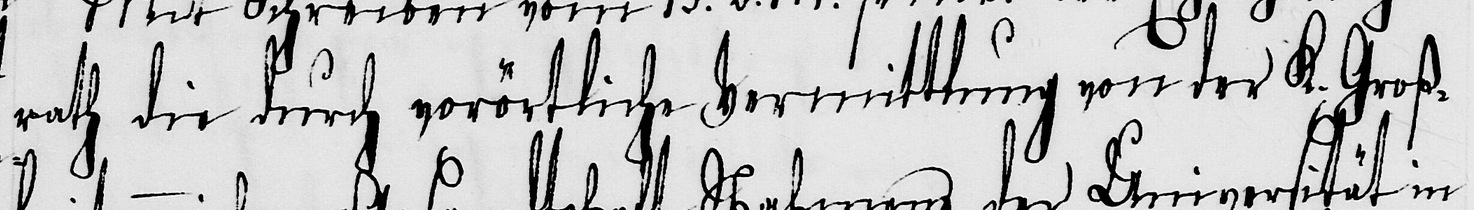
rath die durch vorörtliche Vermittlung von der K. Groß¬
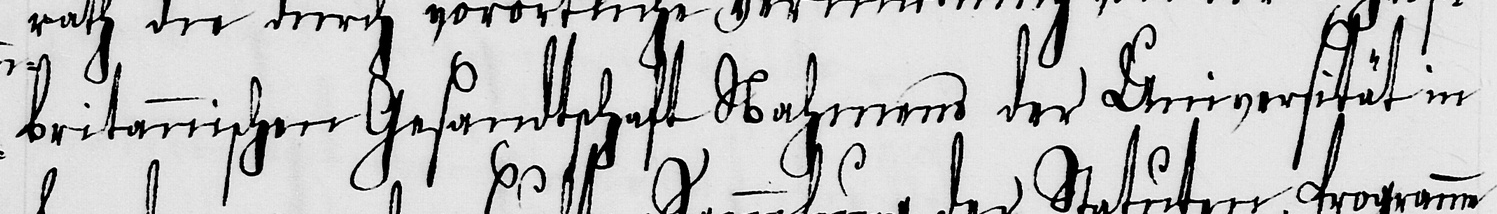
britannischen Gesandtschaft Nahmens der Universität in
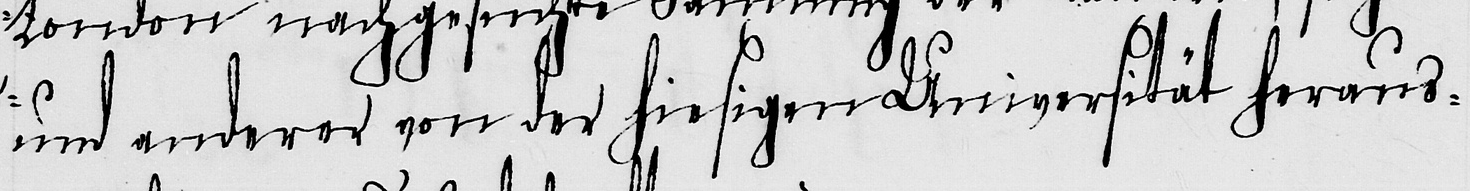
und anderer von der hiesigen Universität heraus¬
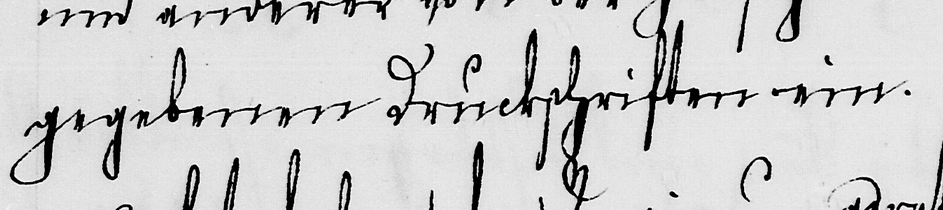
gegebenen Druckschriften ein.
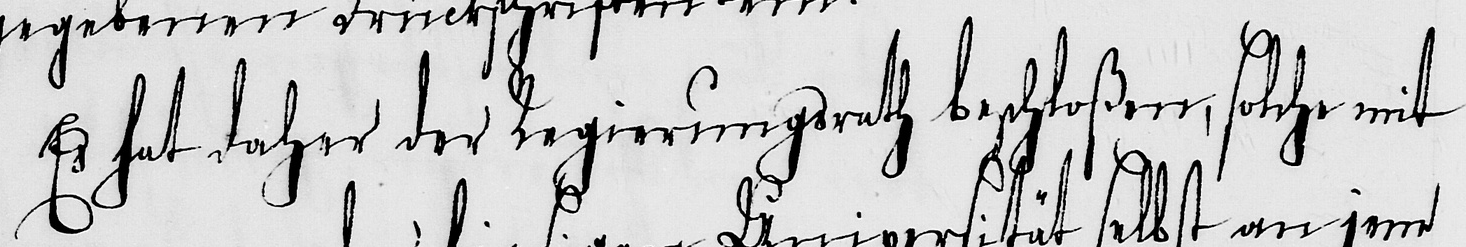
Es hat daher der Regierungsrath beschloßen, solche mit
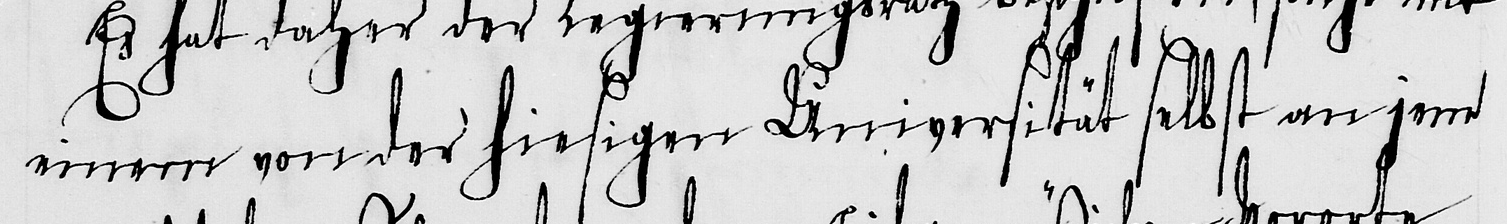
einem von der hiesigen Universität selbst an jene
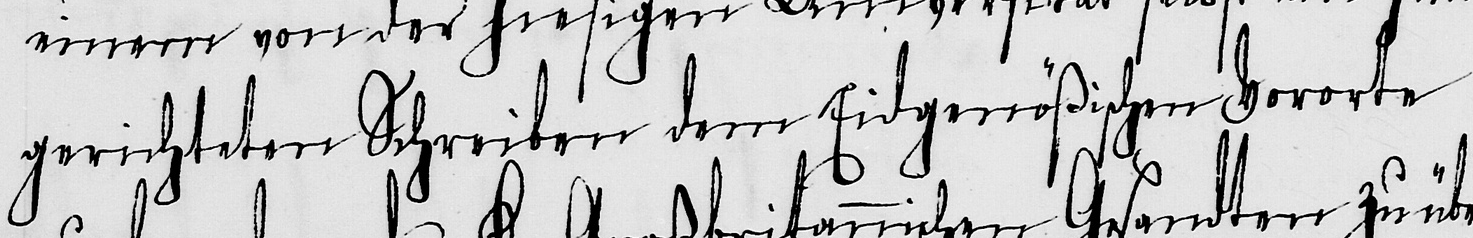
gerichteten Schreiben dem Eidgenößischen Vororte
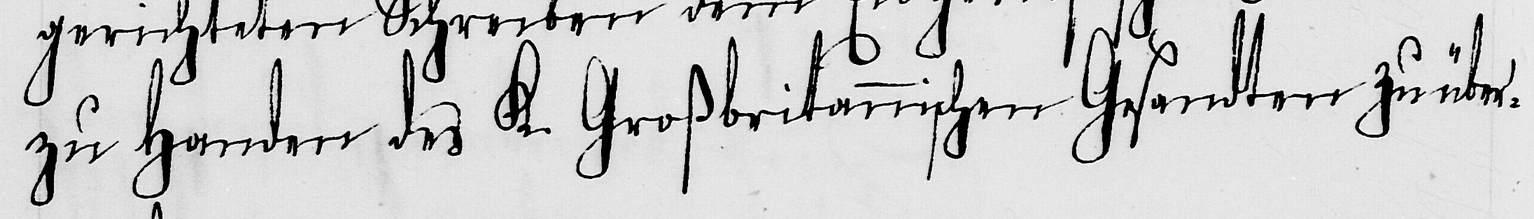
zu Handen des K. Großbritannischen Gesandten zu übe¬
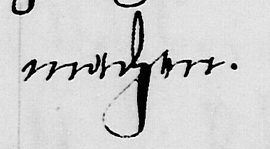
rmachen.
